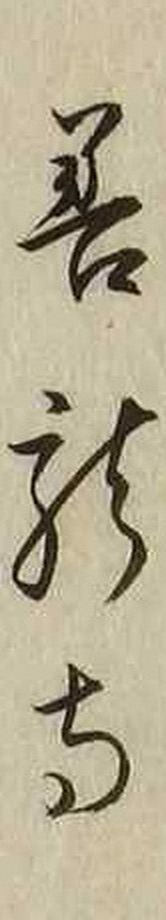善龍寺
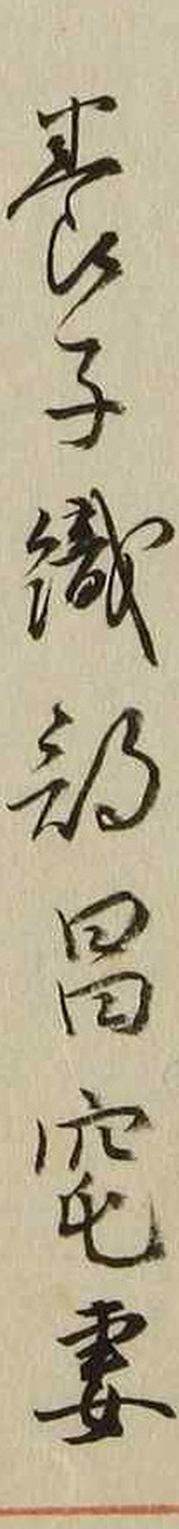女養子織部昌窀妻
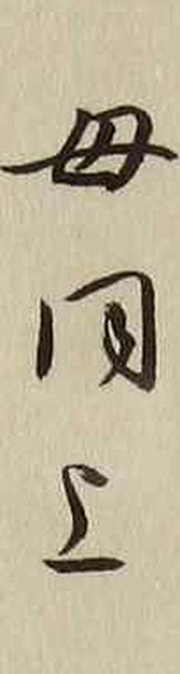母同上
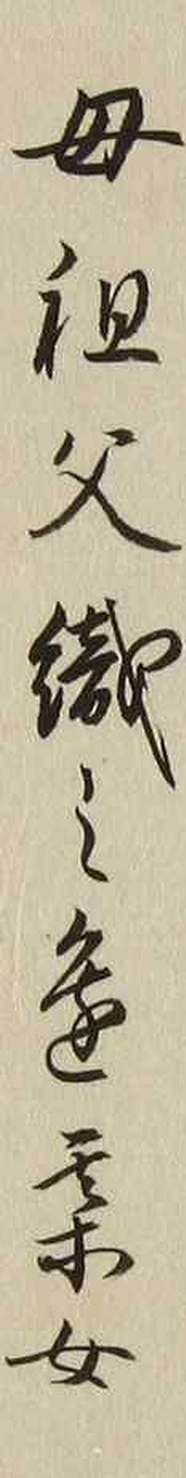母祖父織之進某女
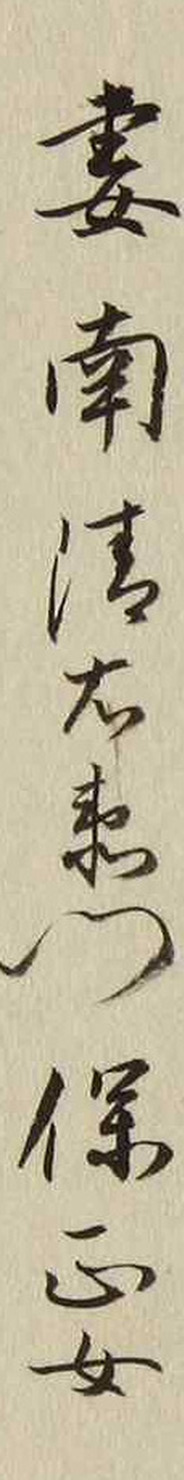妻南清右衛門保正女
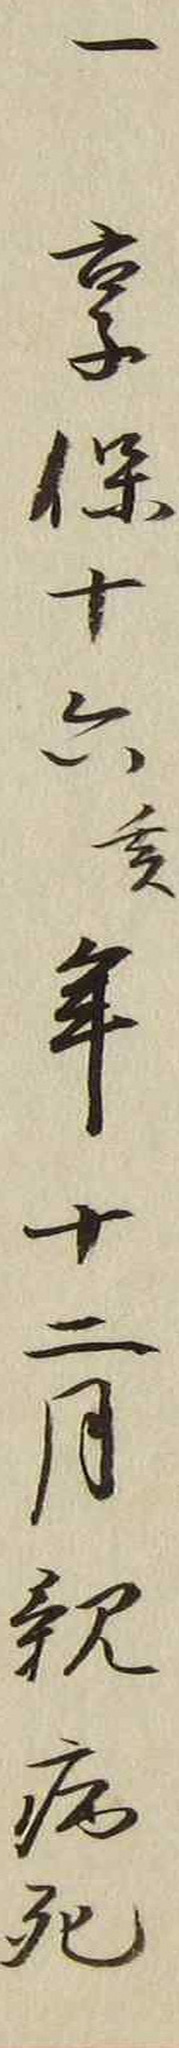一享保十六亥年十二月親病死
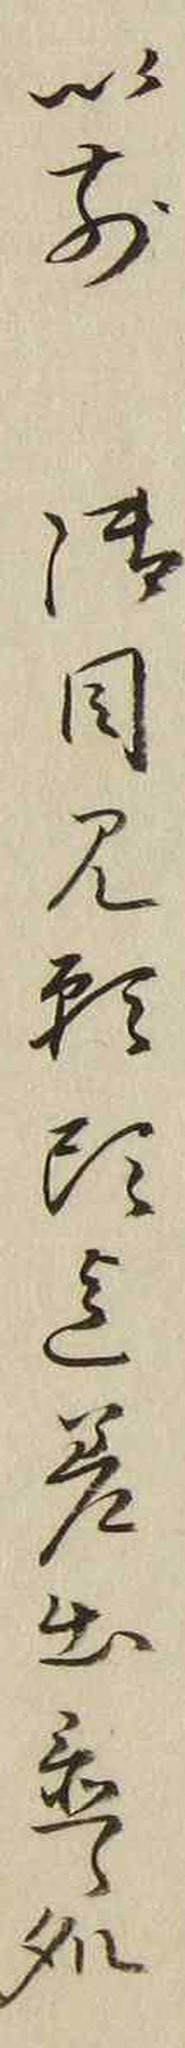以前御目見願頭迄差出置候処

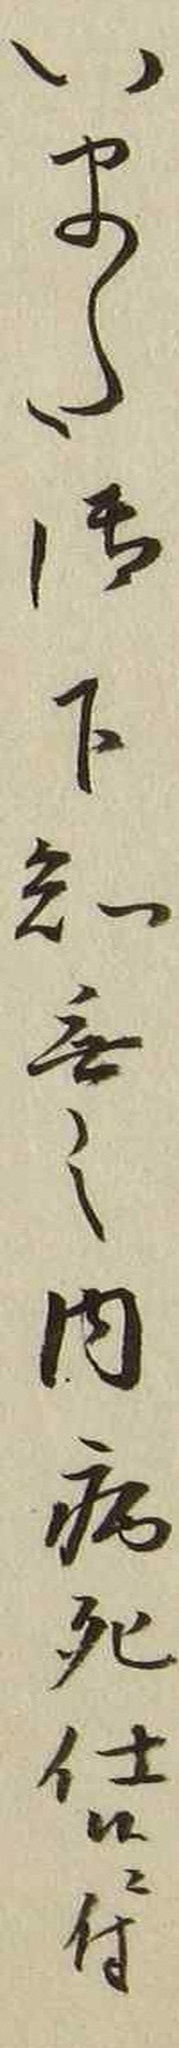いまた御下知無之内病死仕侯ニ付
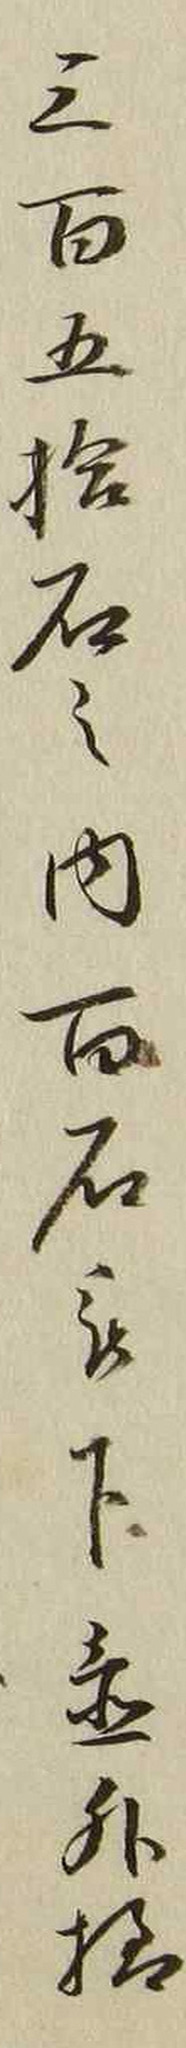三百五拾石之内百石被下置外様
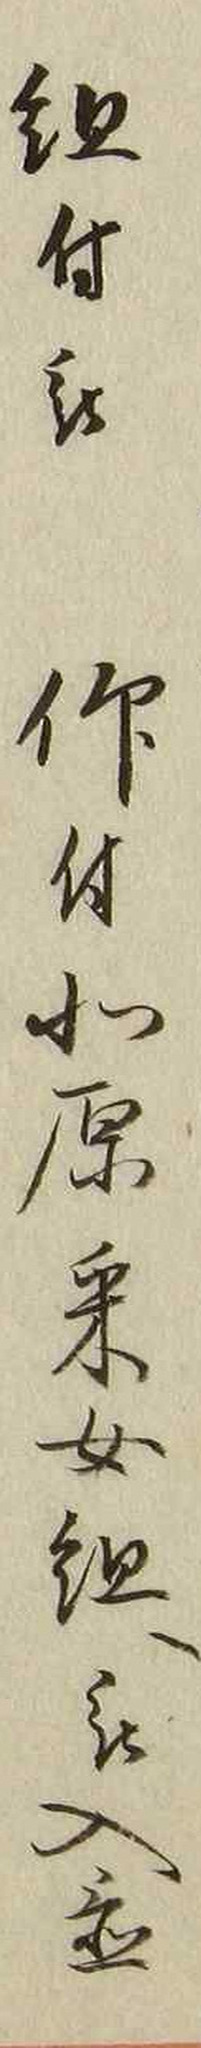組付被仰付北原采女組へ被入置
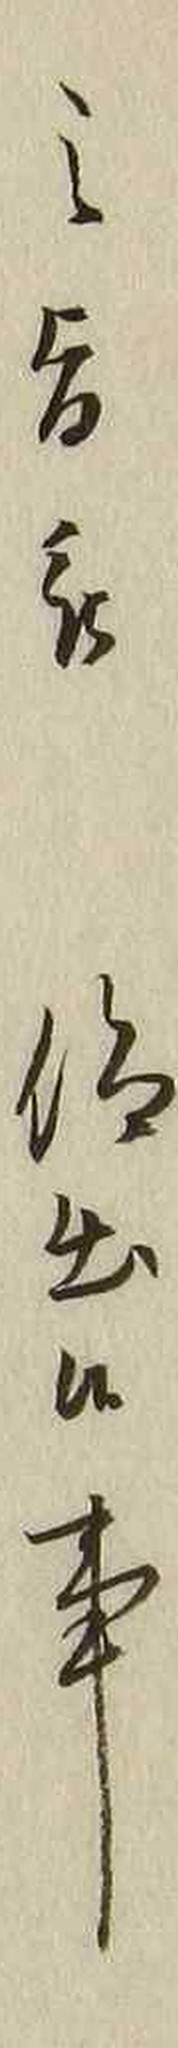之旨被仰出候事
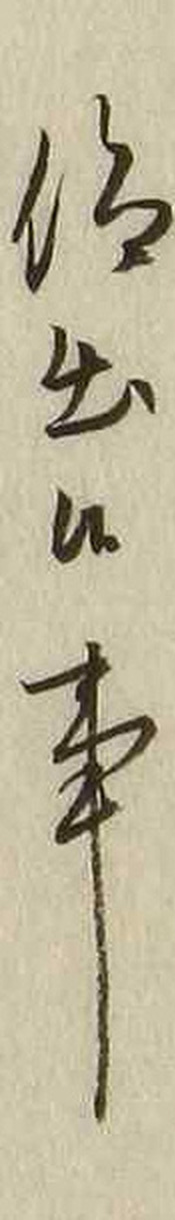仰付候事
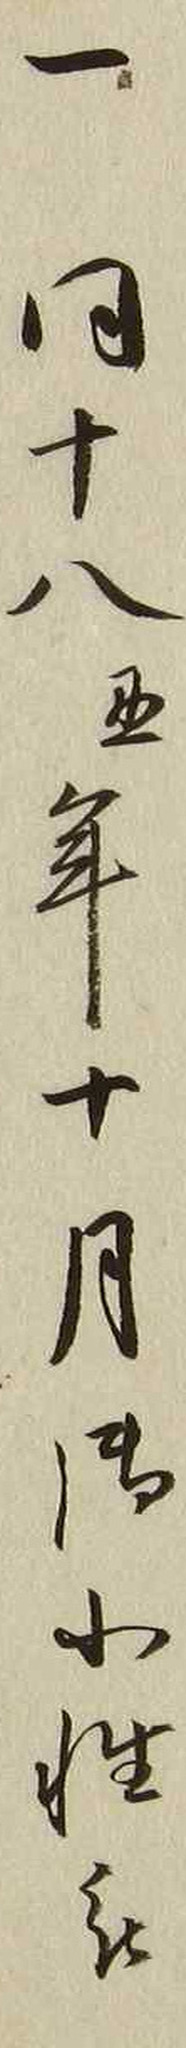一同十八丑年十月御小性被
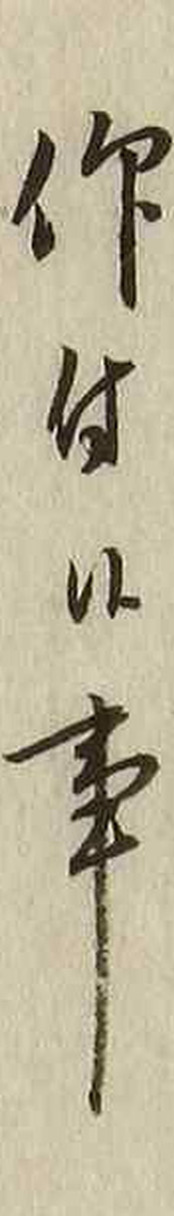仰付候事
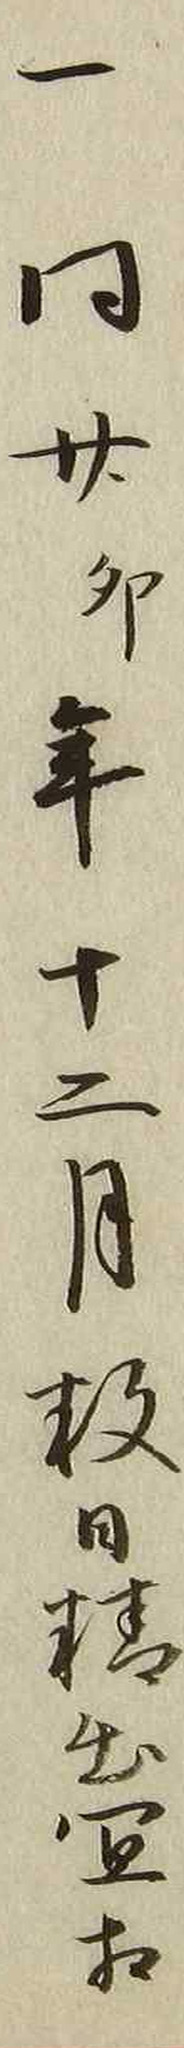一同廿卯年十二月数日精出宜相
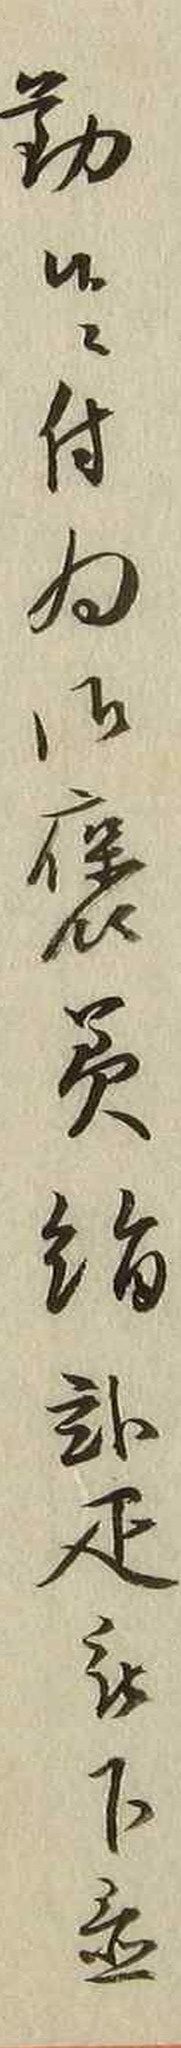勤候ニ付為御褒美絹弐疋被下置
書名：諸士系譜　巻之22　い之部22
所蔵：会津若松市立会津図書館
